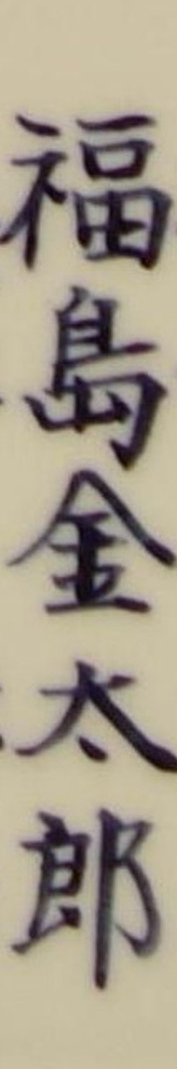福島金太郎
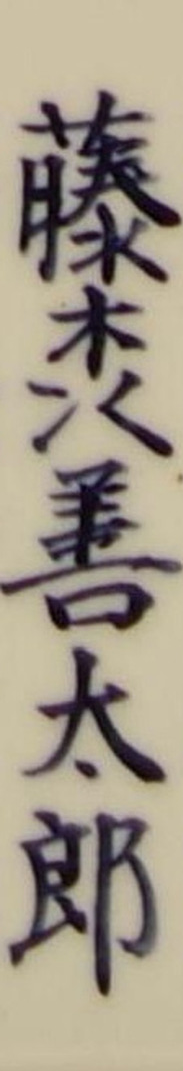藤森善太郎
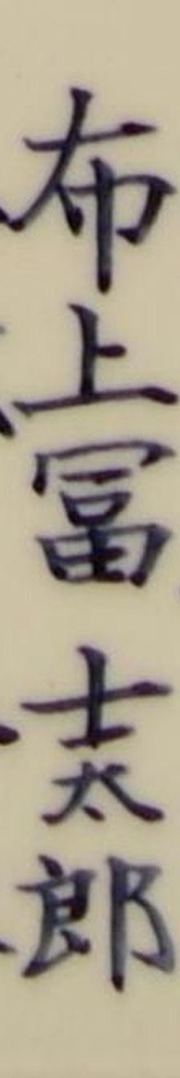布上冨士太郎
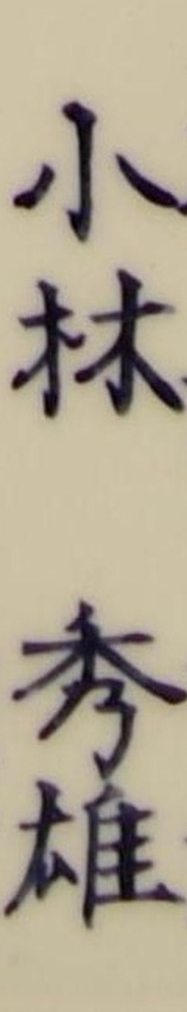小林秀雄
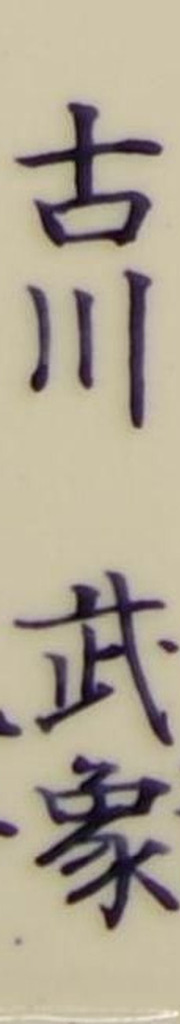古川武象

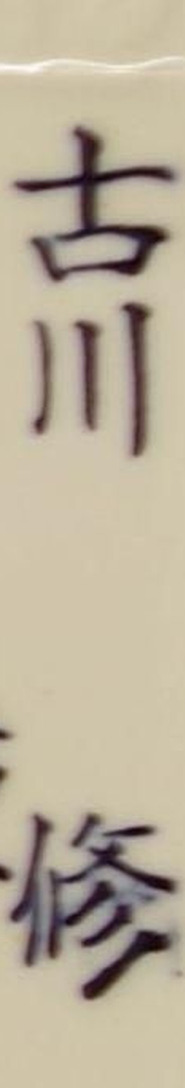古川修
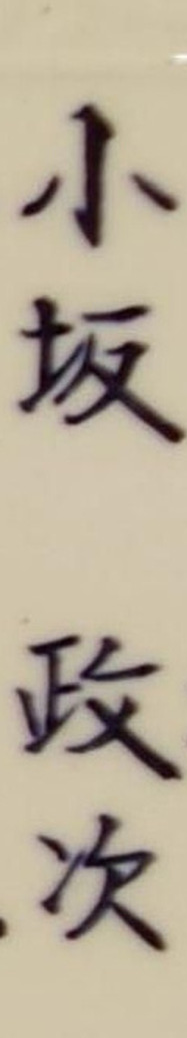小坂政次
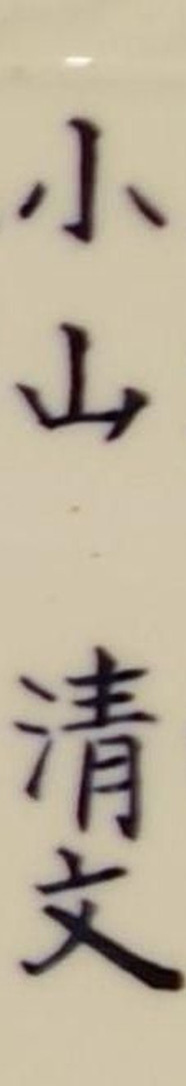小山清文
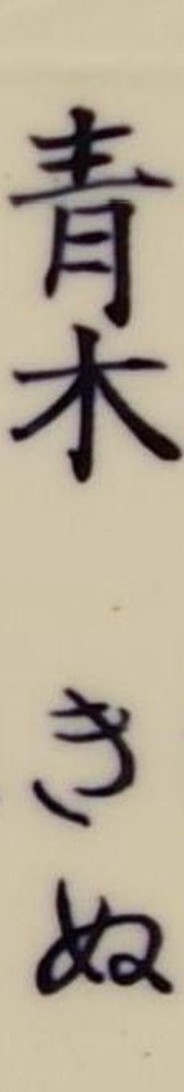青木きぬ
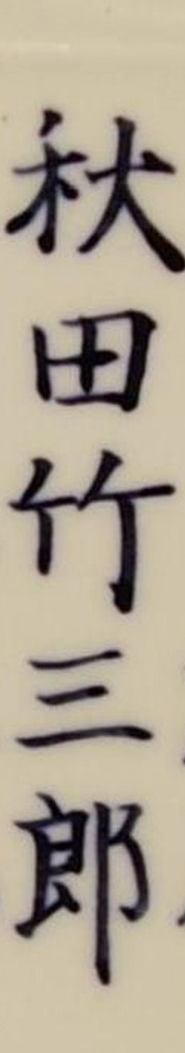秋田竹三郎
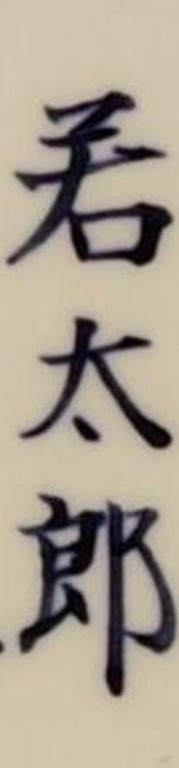若太郎
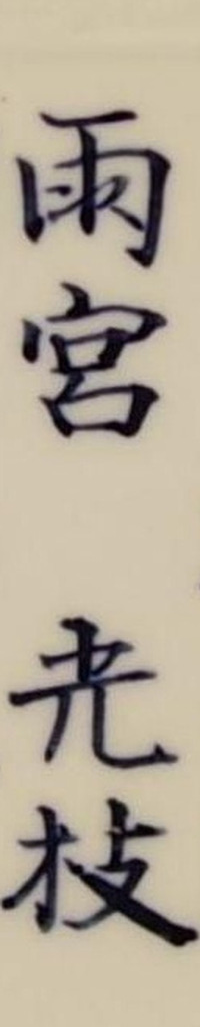雨宮光枝
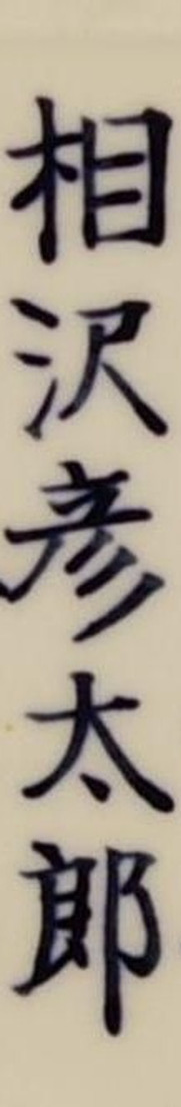相沢彦太郎
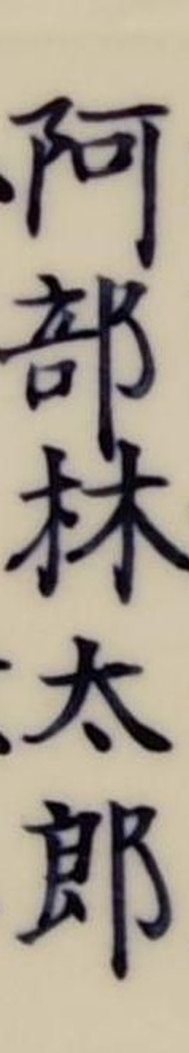阿部林太郎
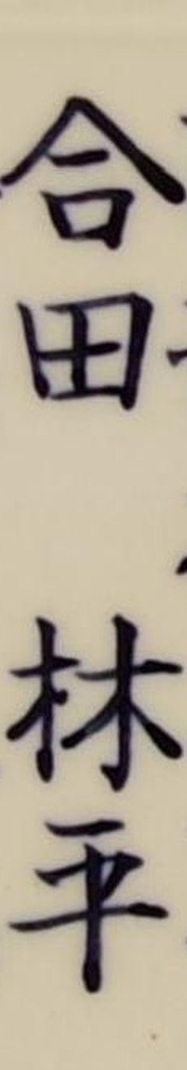合田林平
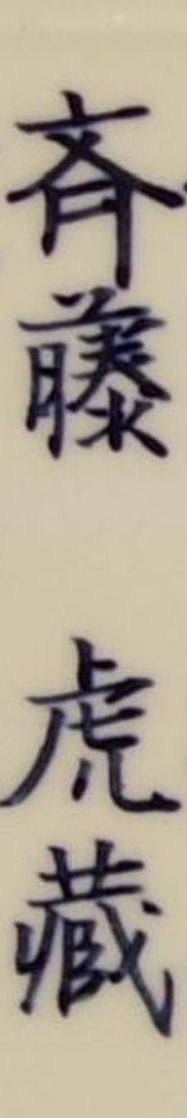斉藤虎蔵
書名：E~L
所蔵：高野山金剛峯寺
